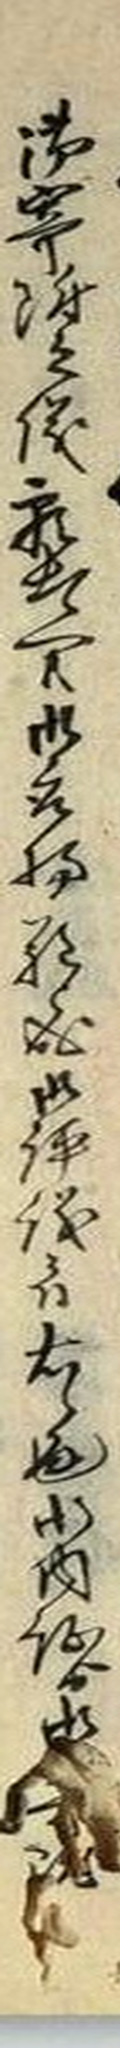御寄付之儀願出候へ共御取扱難成御評議ニ付右之通御内証ゟ御
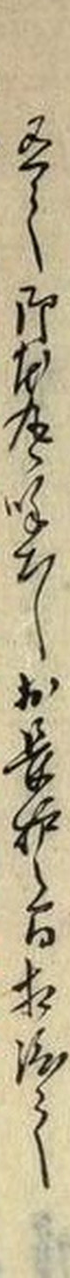有之御本丸へ呼出之於長炉之間相渡之
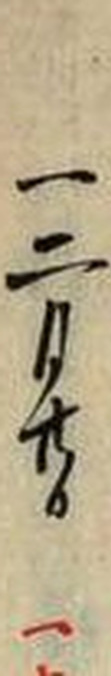一二月廿日
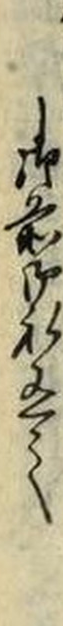御前御礼有之

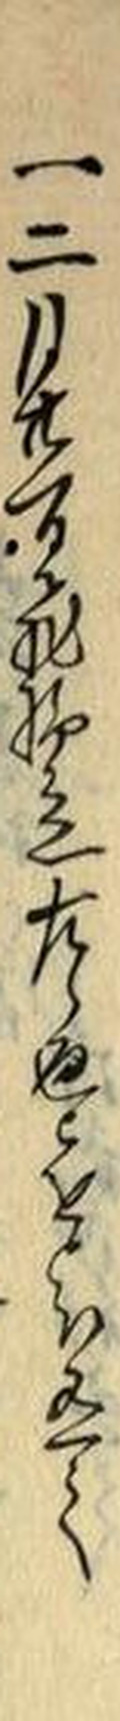一二月廿一日飛脚立左之通被進被下有之
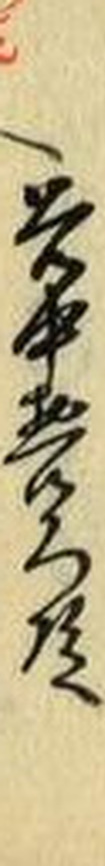谷中惣左衛門殿
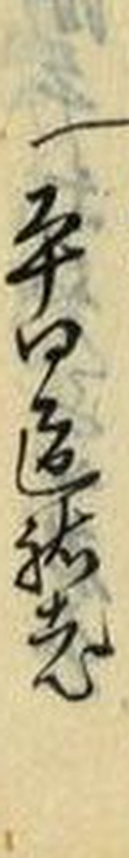平田道祐老
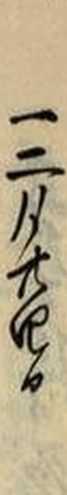一二月廿四日
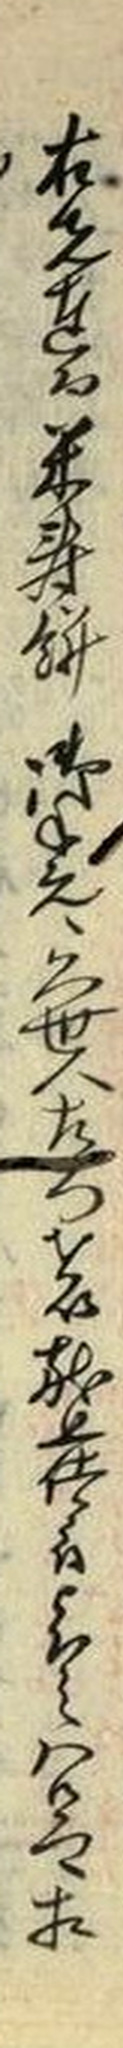右先達而米寿餅御手元へ久世八左衛門を以献上仕候ニ付被下之八左衛門へ相
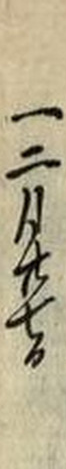一二月廿七日
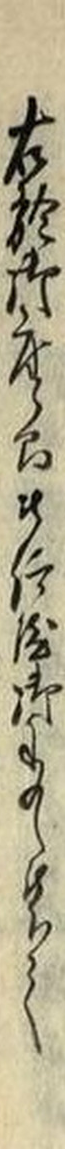右於御座之間被仰渡御手のし被下之
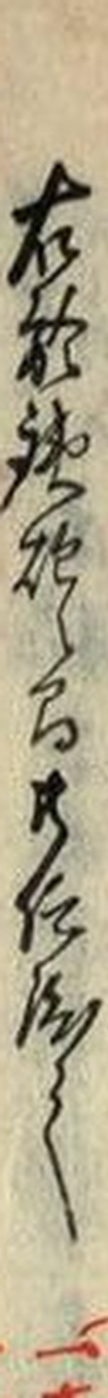右於鉄炮之間被仰渡之
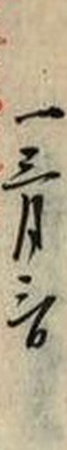一三月三日
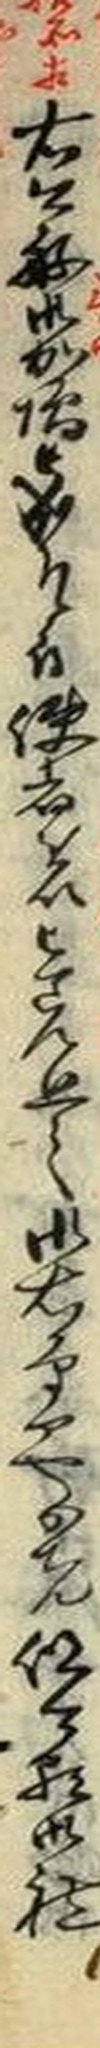右今般御加増被成下候ニ付使者を以被差上之御右筆部やゟ出ル但今朝御礼
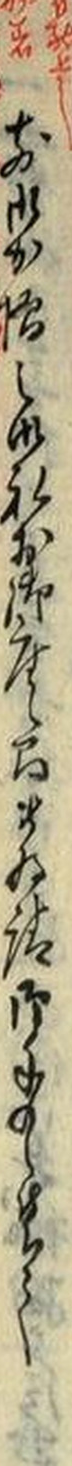前御加増之御礼於御座之間被為請御手のし被下之
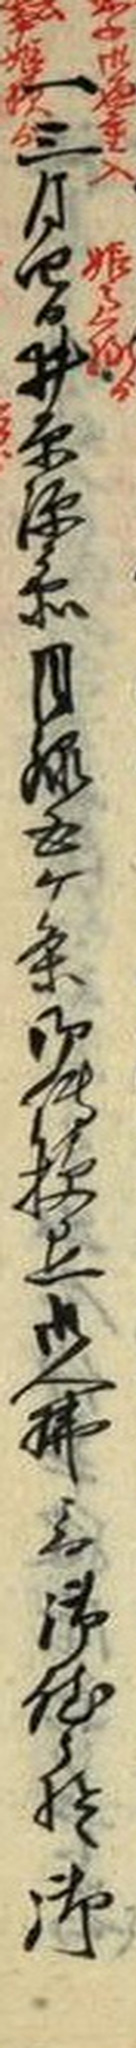一三月四日井原源兵衛目録五ヶ条御伝授申上御人払ニ而御聴被遊候御
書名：少傅日録抄（斉承付側向頭取日記、在国）
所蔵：福井県文書館 Fukui Prefectural Archives
